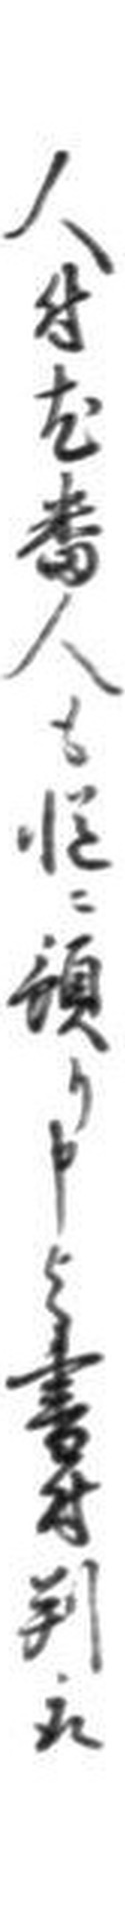人付尤番人も慥ニ預り申与書付判取

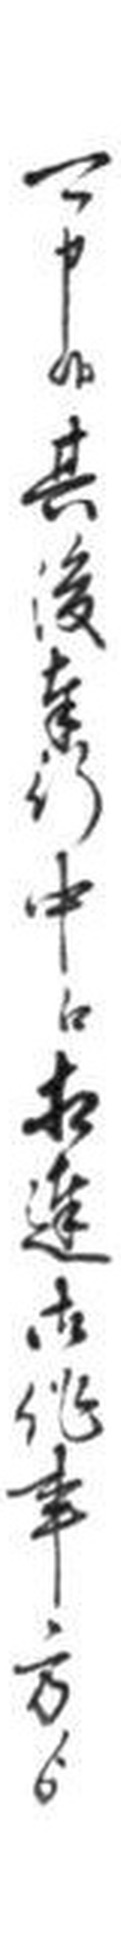可申候其後奉行中江相達御作事方ゟ
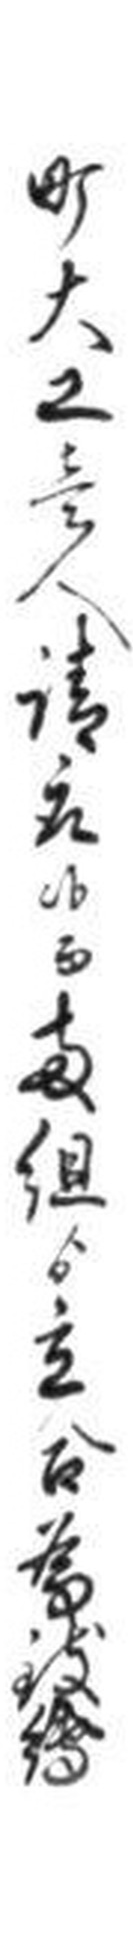町大工壱人請取候而両組ゟ立合為致絵
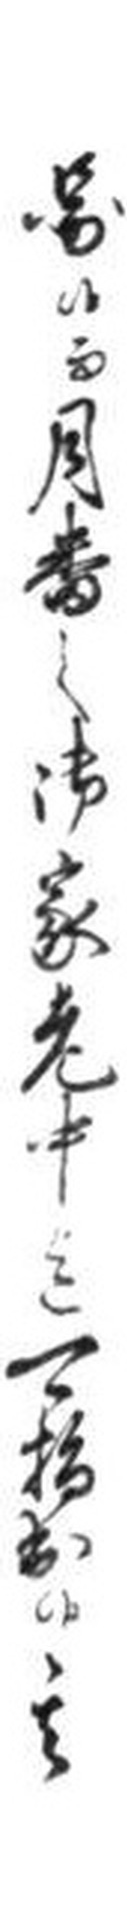図候而月番之御家老中迄可指出候其
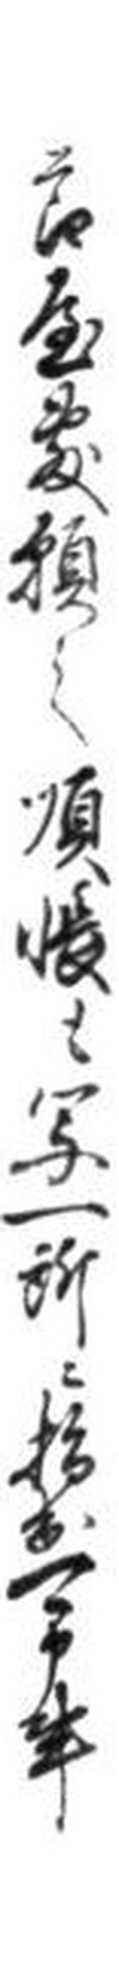節屋敷願之順帳も写一所ニ指出可申事
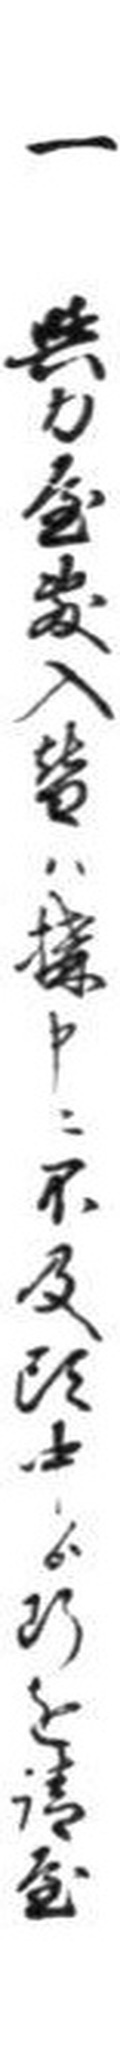一与力屋敷入替ハ構申ニ不及頭ゟ断を請屋
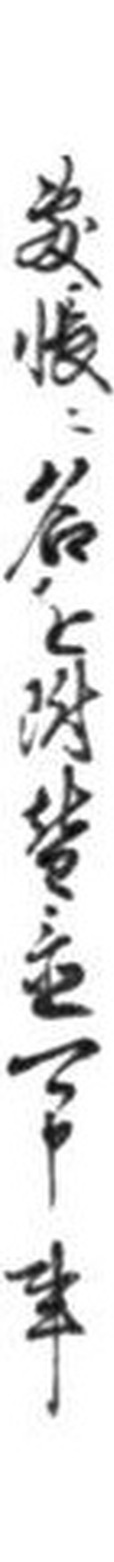敷帳ニ名を付替置可申事
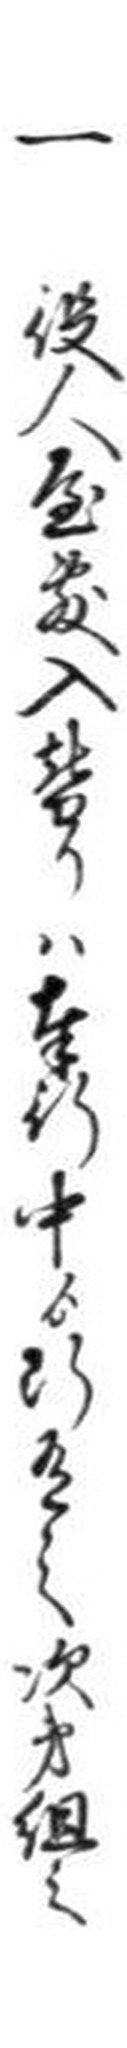一役人屋敷入替りハ奉行中ゟ断有之次第組之
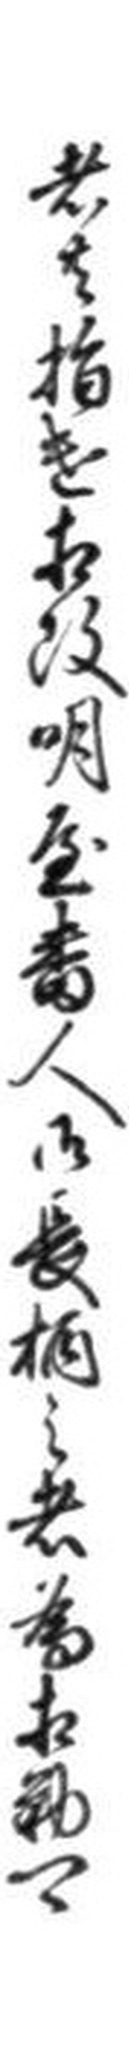者共指遣相改明屋番人御長柄之者為相勤可
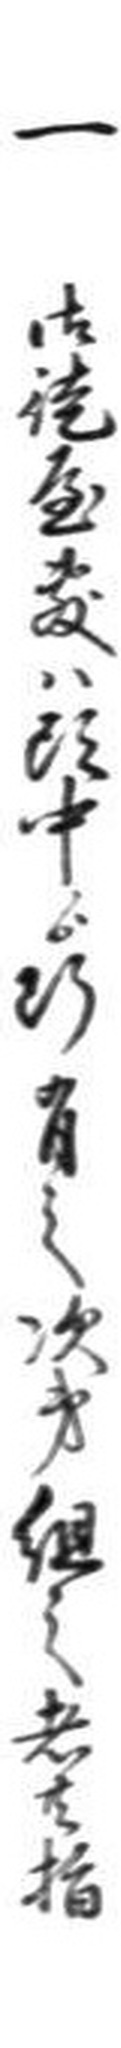一御徒屋敷ハ頭中ゟ断有之次第組之者共指
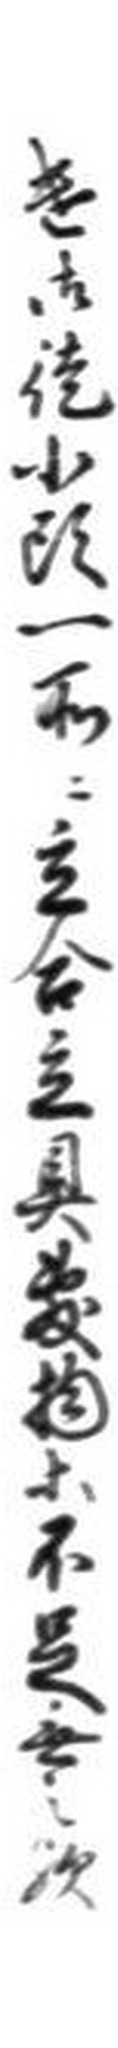遣御徒小頭一所ニ立合立具敷物等不足無之歟
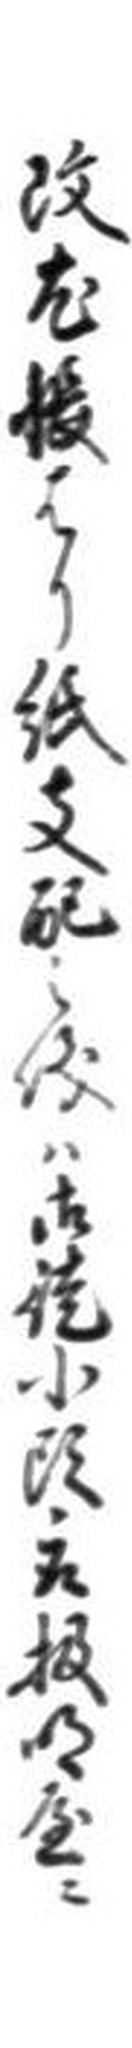改尤帳はり紙支配之儀ハ御徒小頭取扱明屋ニ
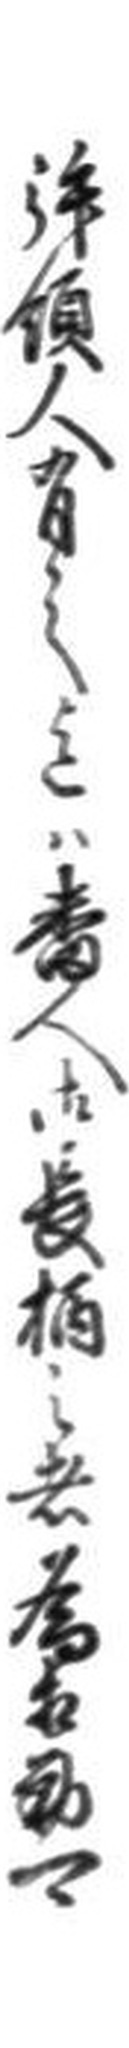拝領人有之迄ハ番人御長柄之者為相勤可
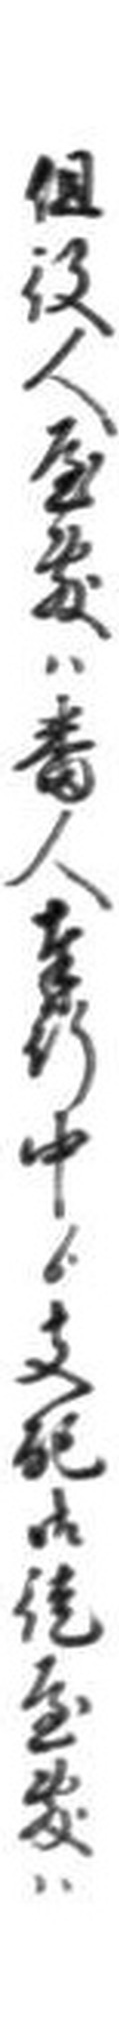但役人屋敷ハ番人奉行中ゟ支配御徒屋敷ハ
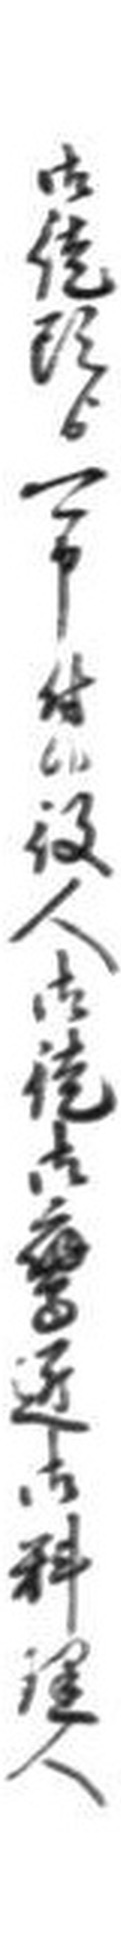御徒頭ゟ可申付候役人御徒御鷹匠御料理人
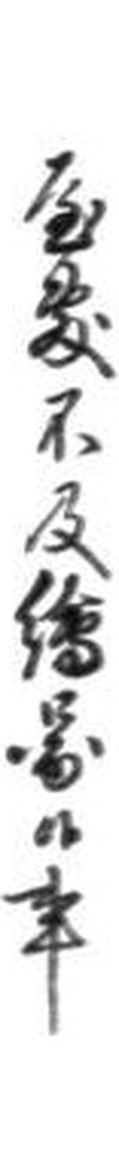屋敷不及絵図候事
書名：家譜 三十二 吉邦公 従享保二年到享保三年
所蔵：福井県文書館 Fukui Prefectural Archives
